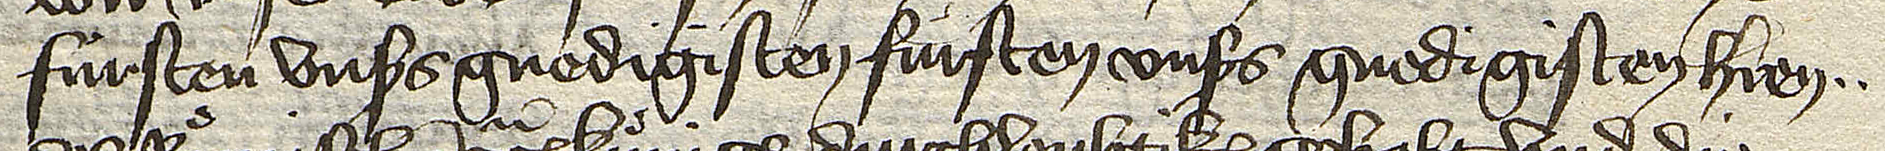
fürſten vnſ*s gnedigiſten fürſten vnſ*s gnedigiſten h*ren ~
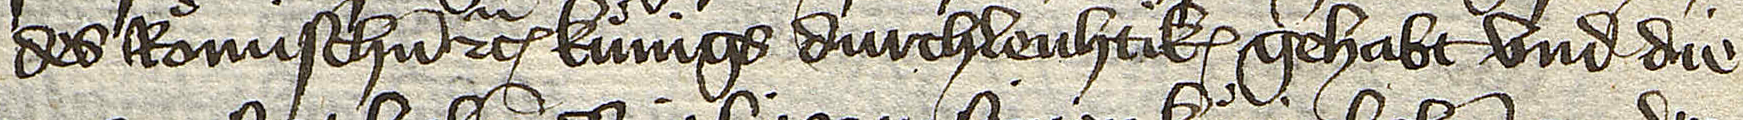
des Römiſchn* ec* künigs durchleuhtik* gehabt vnd die
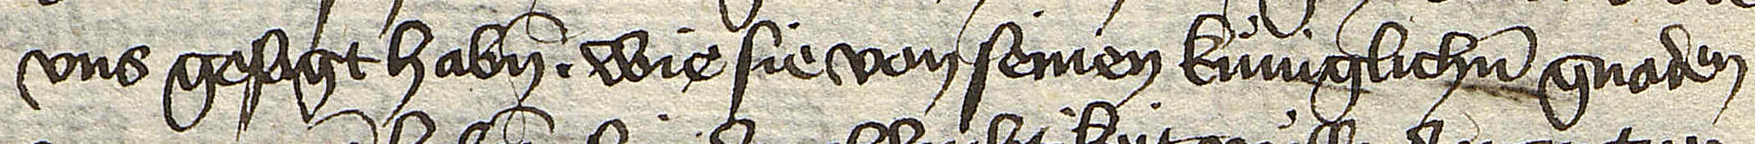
vns geſagt habn* . wie ſie von ſeinen küniglichn* gnaden
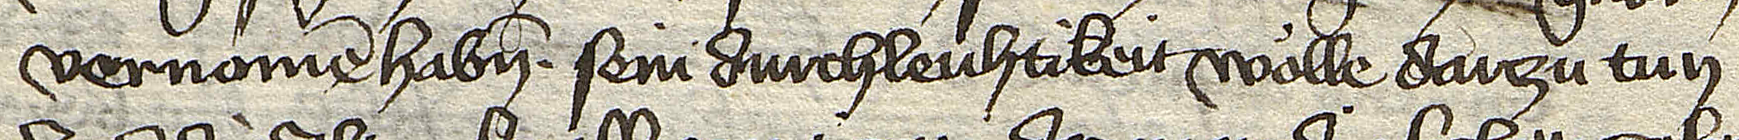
vernome* habn* ſein durchleuhtikeit wölle darcʒu tun
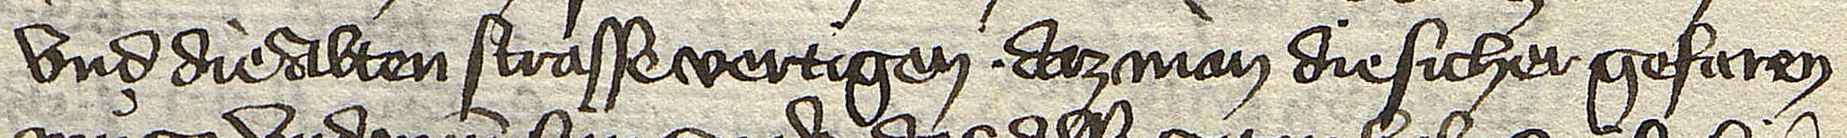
vnd die Alten ſtraſſe vertigen . daʒ man die ſicher gefaren
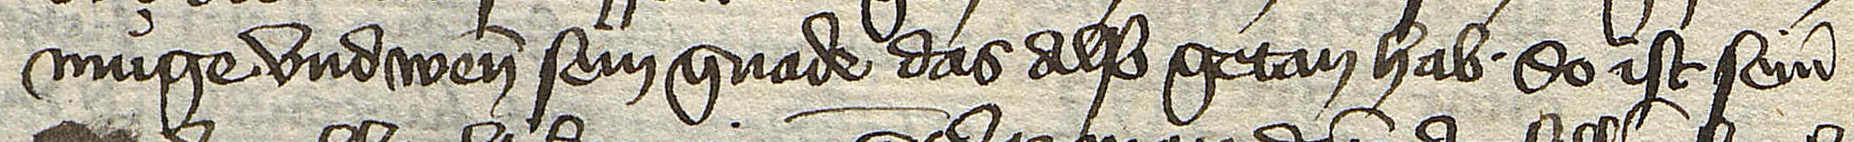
müge vnd wen* ſein gnade das alſo getan hab . So iſt ſein*
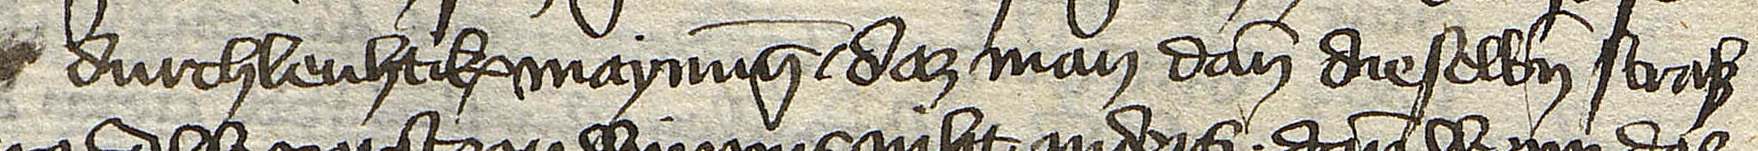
durchleuhtik* maynu*g / daʒ man dan* die ſelbn* ſtraſʒ
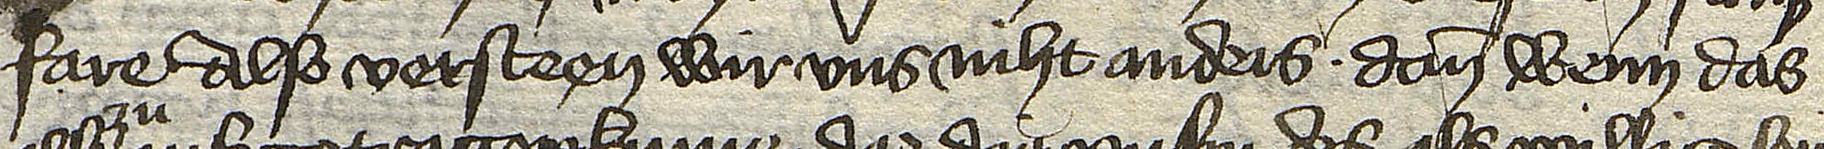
fare Alſo verſteen wir vns niht anders . dan* wenn das
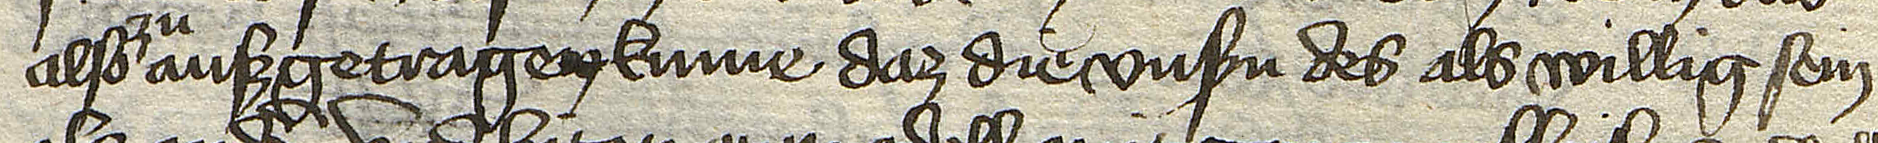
alſo auſʒgetrafen kume daʒ die vnſ*n des als willig ſein
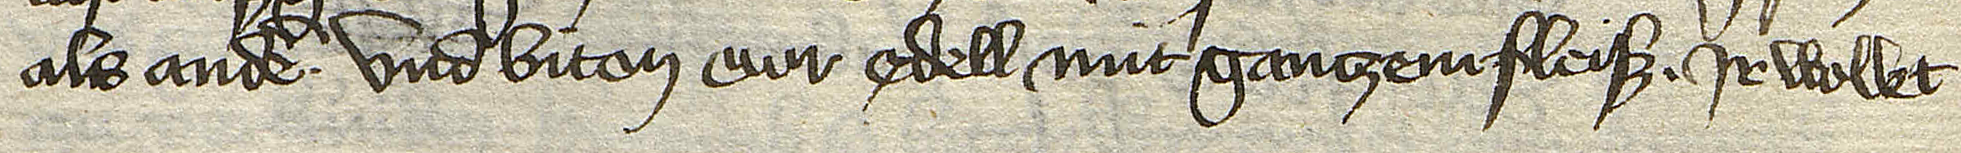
als ande* . vnd biten ewr edell mit gancʒem fleiſʒ . Ir wollet
